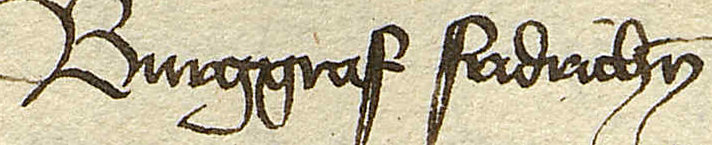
Burggraf Fridrichn*
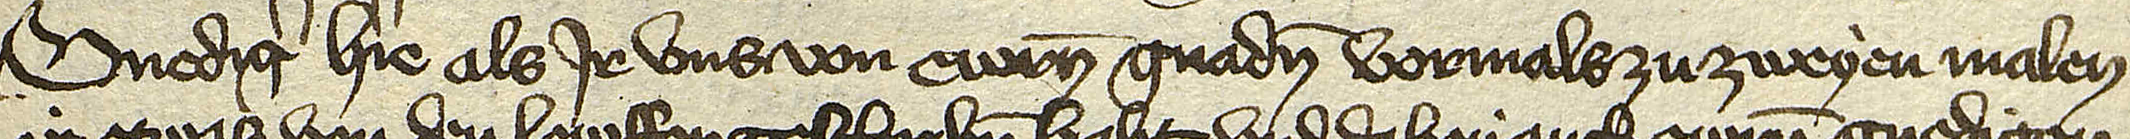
Gnedig* h*re als Ir vns von ewrn* gnadn* vormals cʒu cʒweyen malen
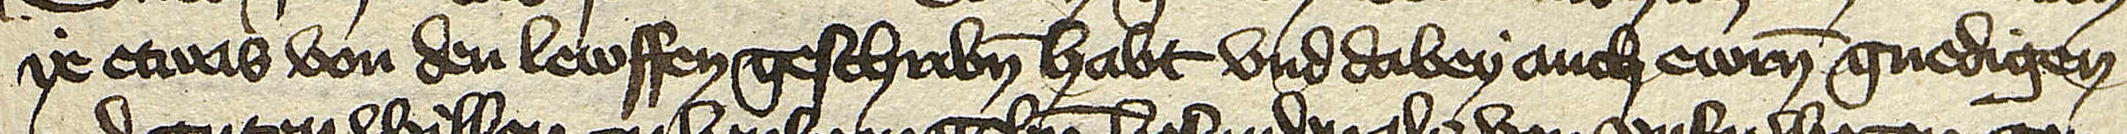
ye etwas von den lewffen geſchribn* habt vnd dabey auch ewrn* gnedigen
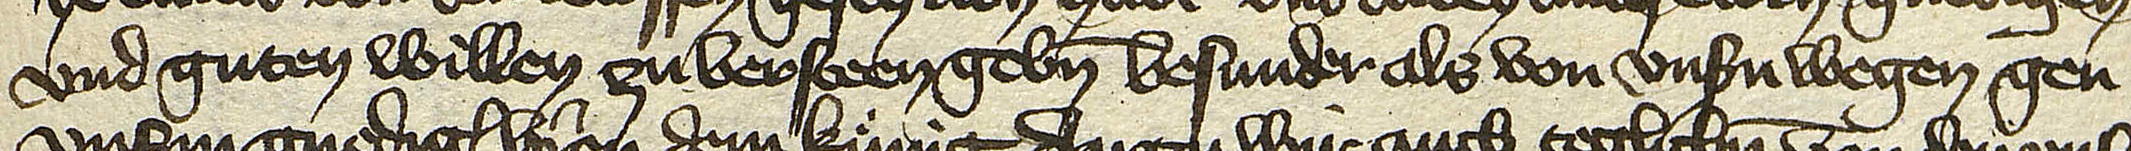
vnd guten willen cʒu verſteen gebn* beſunder als von vnſ*n wegen gen
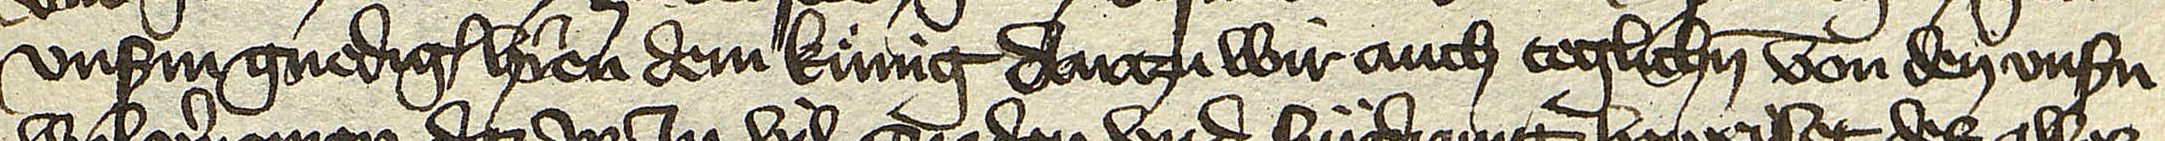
vnſ*m gnedig* hr*en dem künig darcʒu wir auch teglichn* von den vnſ*n
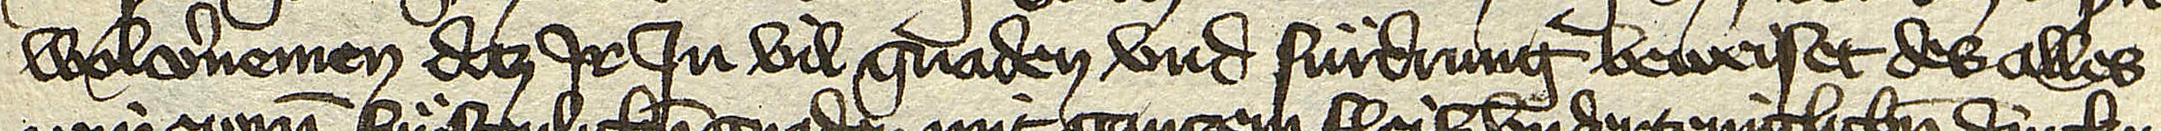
wol v*nemen dacʒ Ir In vil gnaden vnd fürdrung beweiſet des alles
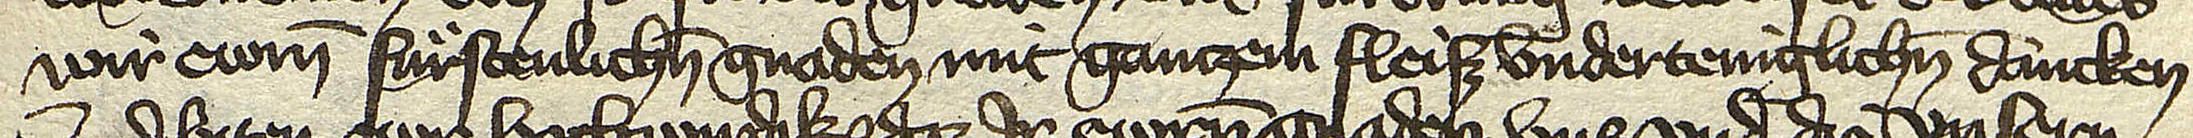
wir ewrn* fürſtenlichn* gnaden mit gancʒem fleiſʒ vnderteniglichn* dancken
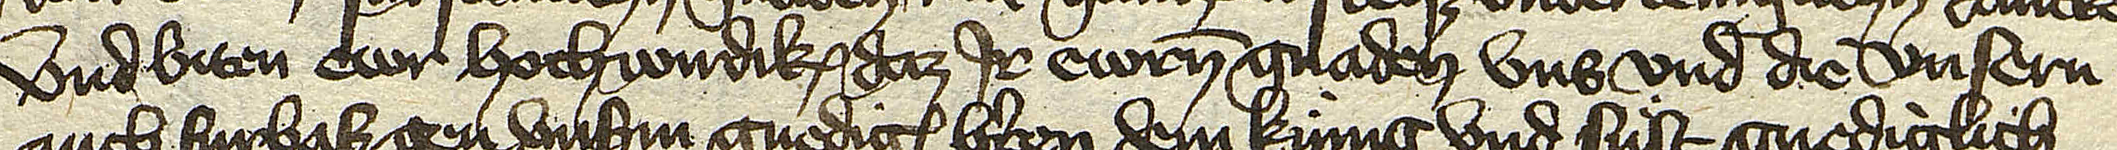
vnd biten ewr hochwirdik* daʒ Ir ewrn* gnaden vns vnd die vnſern
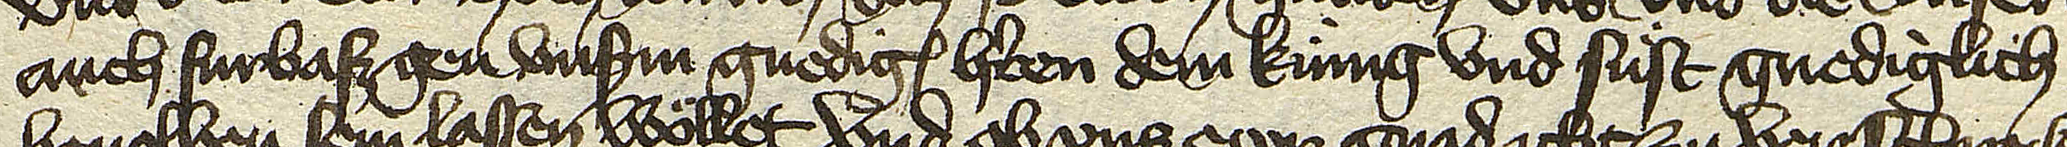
auch furbaſʒ gen vnſ*m gnedig* h*ren dem künig vnd ſüſt gnediglich
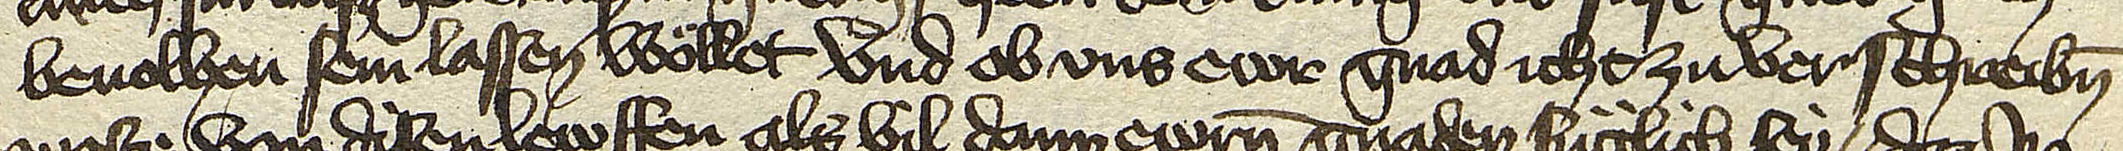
beuolhen ſein laſſen wöllet vnd ob vns ewr gnad icht cʒu verſchreibn*
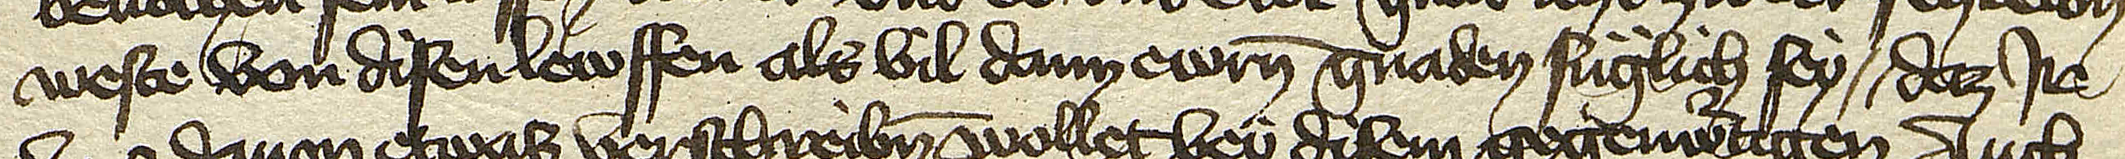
weſte von diſen lewffen als vil dann ewrn* gnaden füglich ſey / daʒ Ir
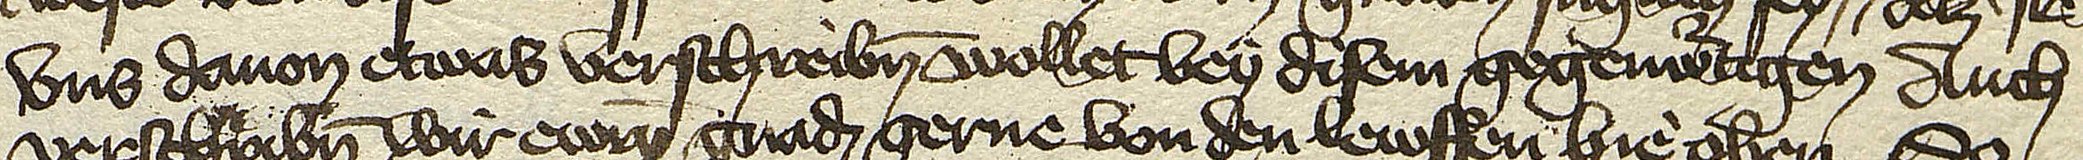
vns dauon etwas verſchreibn* wollet bey diſem gegenw*tigen Auch
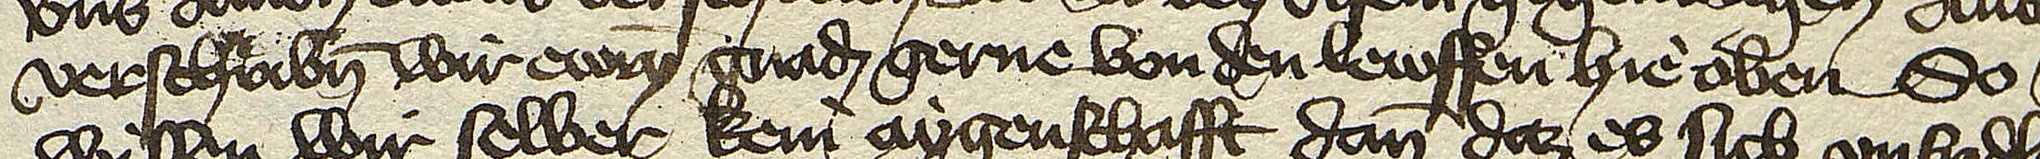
verſchribn* wir ewrn* gnad* gerne von den lewffen hie oben So
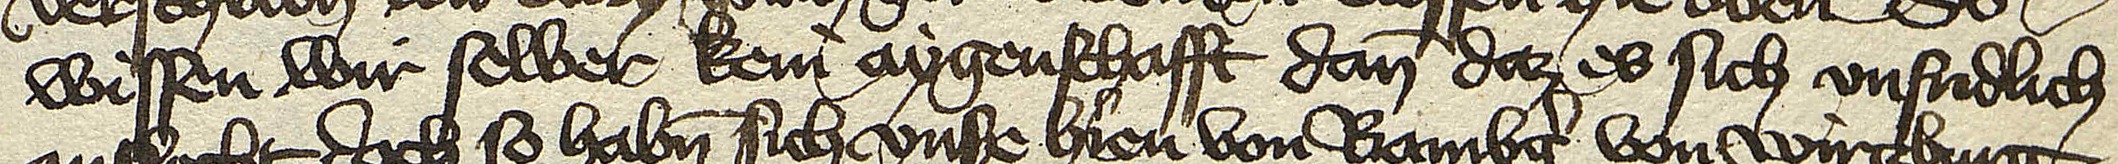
wiſſen wir ſelber kein aygenſchafft dan* daʒ es ſich vnfridlich
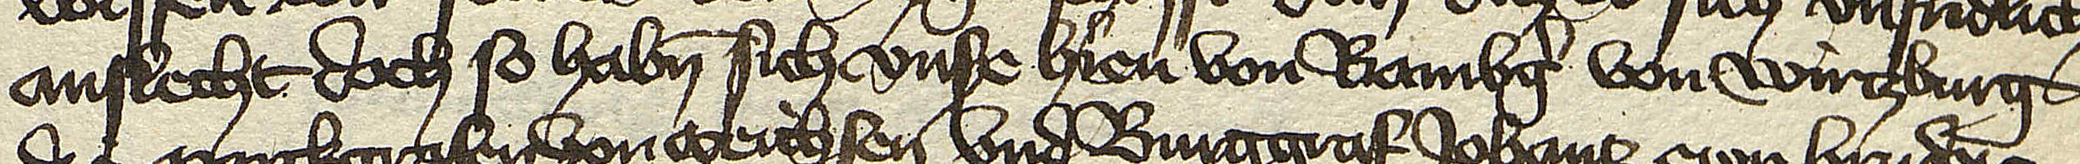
anſlecht doch ſo habn* ſich vnſ*e hr*en von Bambg* von wircʒburg
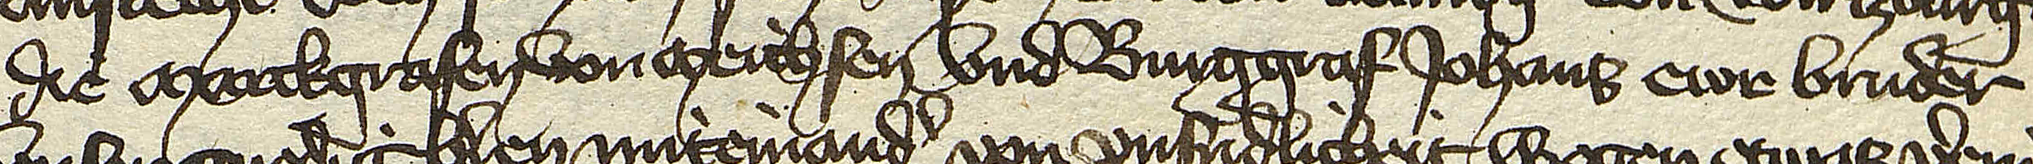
die Marckgrafen von Meichſen vnd Burggrad Iohans ewre bruder
